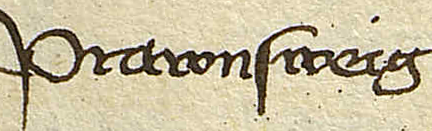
Prawnſweig
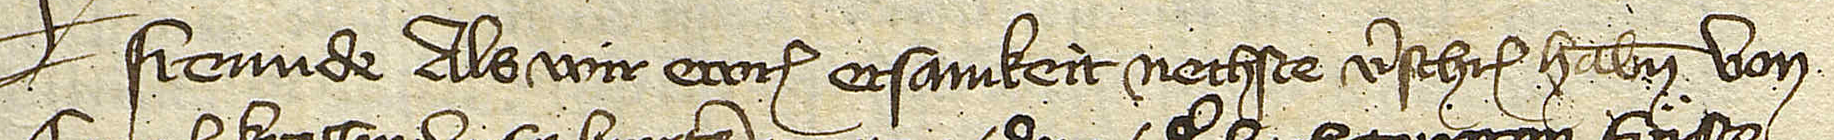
L* freunde Als wir ewr* erſamkeit nechſte v*ſchr* habn* von
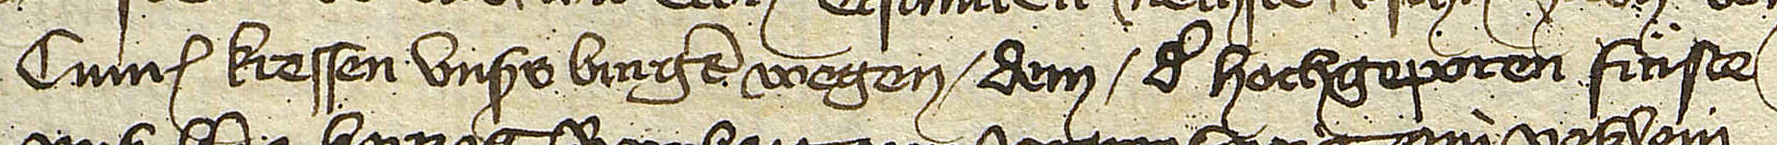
Cunr* kreſſen vnſ*s burg*s wegen / dem / d* hochgeporen fürſte
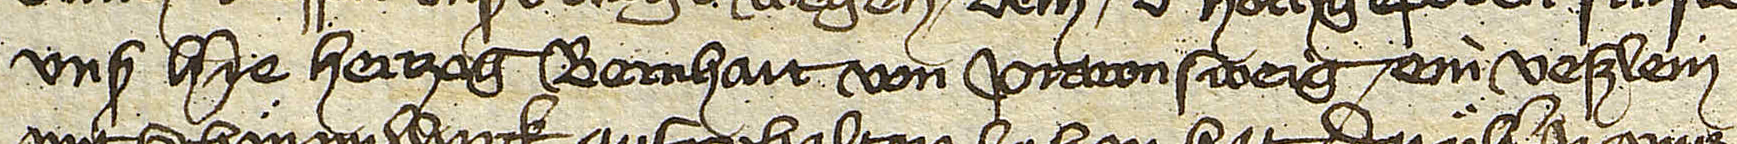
vnſ* h*re hercʒog Bernhart von Prawnſweig / ein veſʒlein
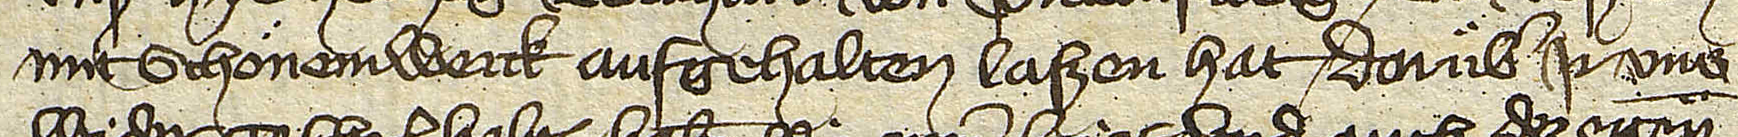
mit Schönemwerck aufgehalten laſʒen hat / darüb* Ir vns
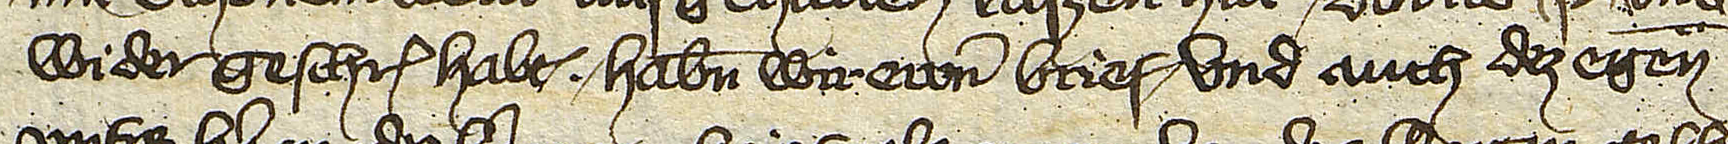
wider geſchr* habt . / habn* wir ewn* brief / vnd auch des egen*
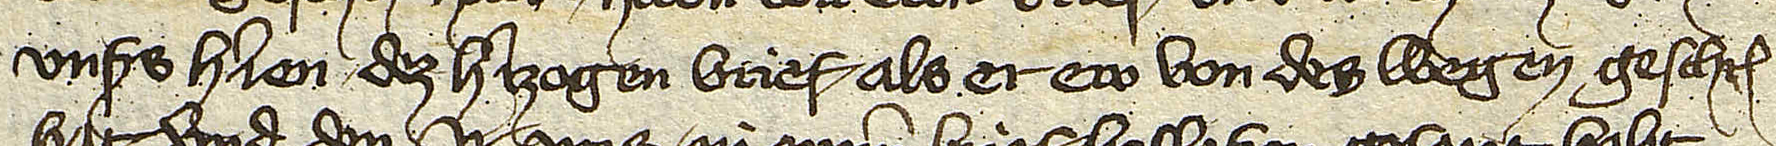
vnſ*s h*ren / deʒ h*cʒogen brief / als er ew von des wegen geſchr*
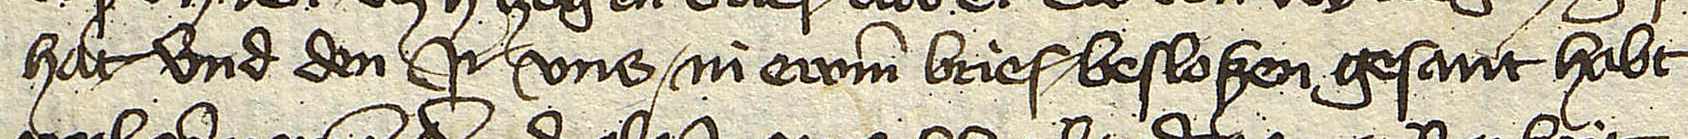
hat / vnd den Ir vns / in ewm* brief / beſloſʒen geſant habt
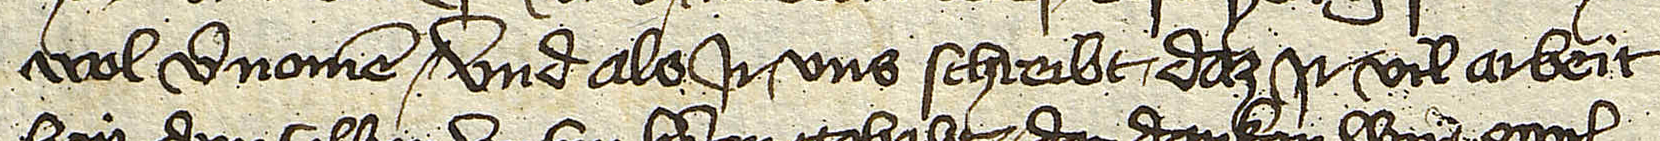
wol v*nome* / vnd als Ir vns ſchreibt / daʒ Ir vil arbeit
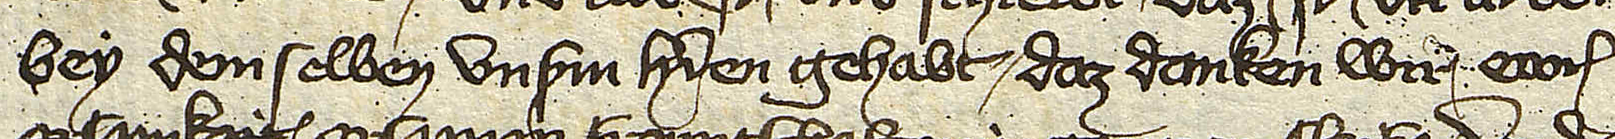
bey demſelben vnſ*m h*ren gehabt / daʒ danken wir ewr*
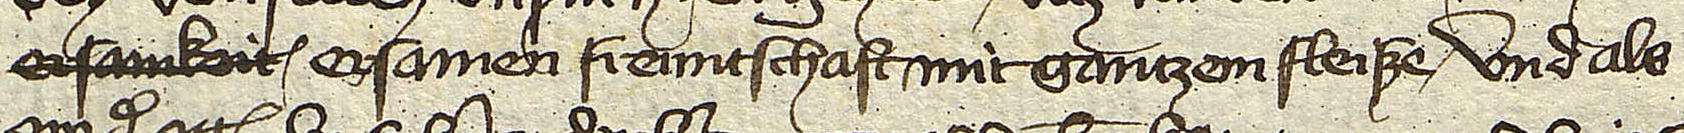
erſamkeit erſamen freuntſchaft mit gancʒem fleiſʒe / Vnd als
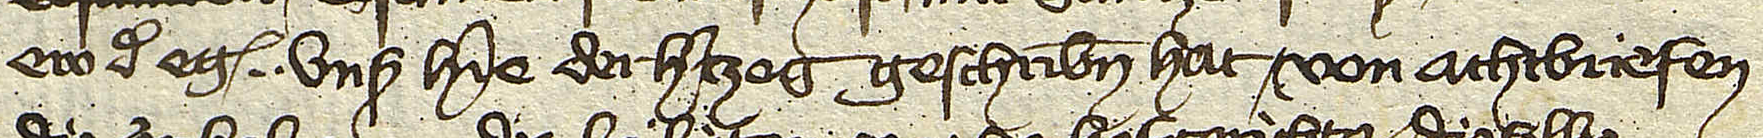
ew d* eg* ~ vnſ* h*re der h*cʒog geſchribn* hat / von achtbriefen
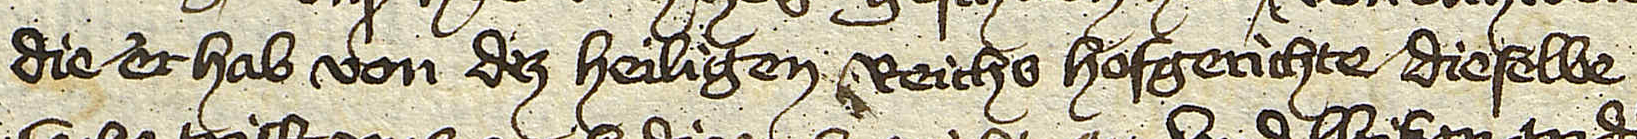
die er hab von deʒ heiligen Reichs hofgerichte / dieſelbe
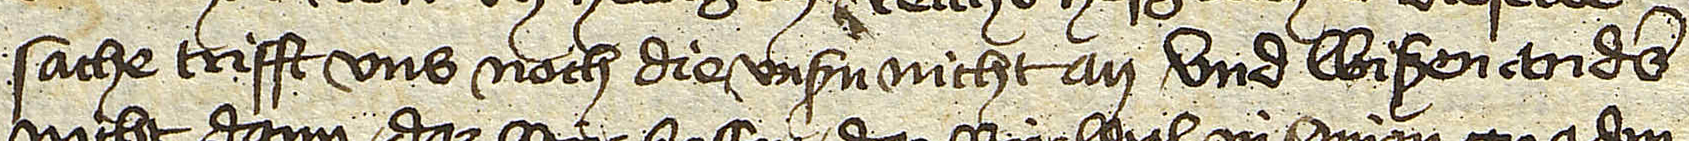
ſache trifft vns noch die vnſ*n nicht an / vnd wiſʒen ands*
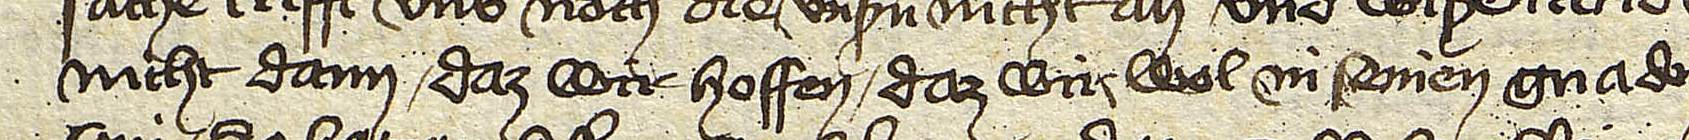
nicht dann / daʒ wir hoffen / daʒ wir wol in ſeinen gnaden
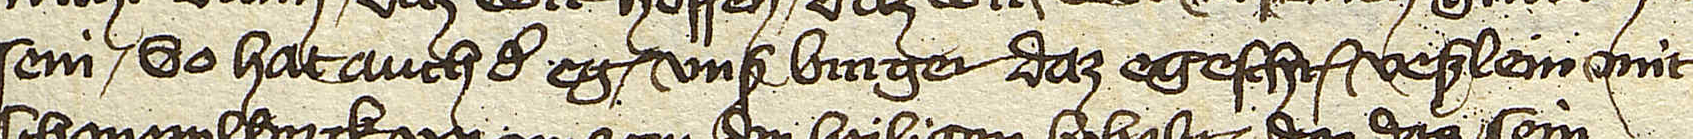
ſein / So hat auch d* eg* vnſ* burger daʒ egeſchr* veſʒlein mit
